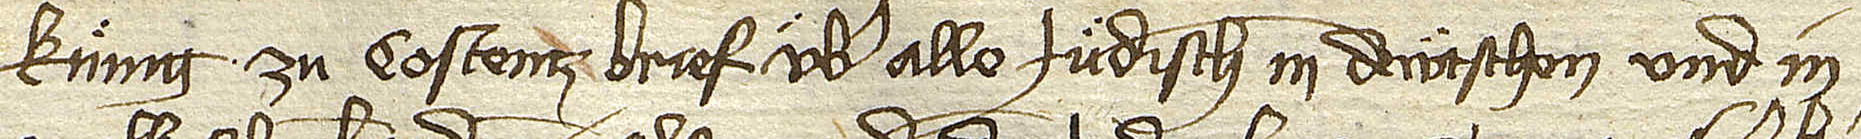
künig ʒu Coſtencʒ brief v̈b* alle Iüdiſch* in dewtſchen vnd in
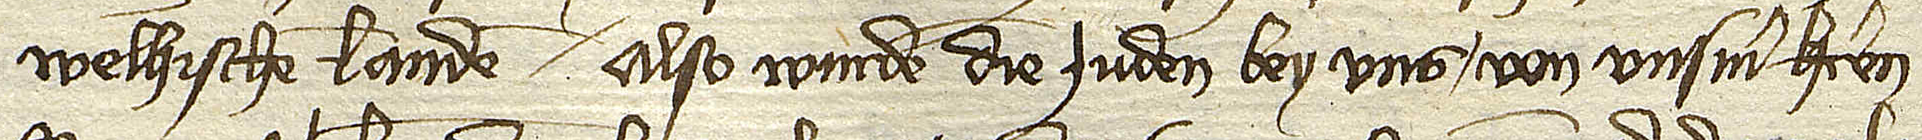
welhiſche* lande* / Alſo wurde* die Iuden bey vns / von vnſ*m h*ren
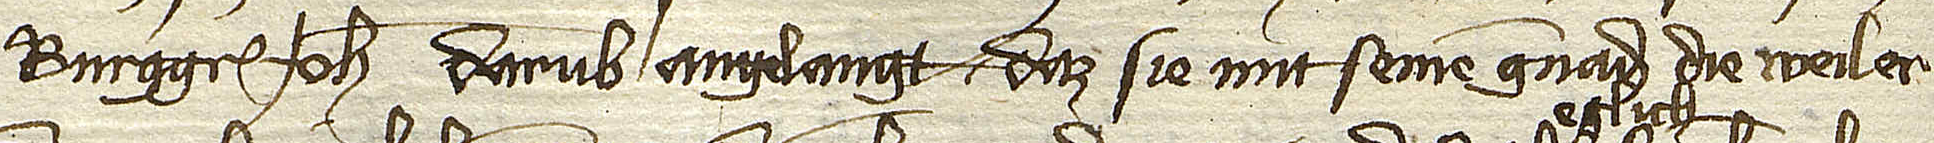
Burggr* Ioh* darub angelangt / daʒ ſie mit ſeine* gnad* die weiler
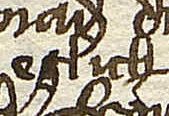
etlich
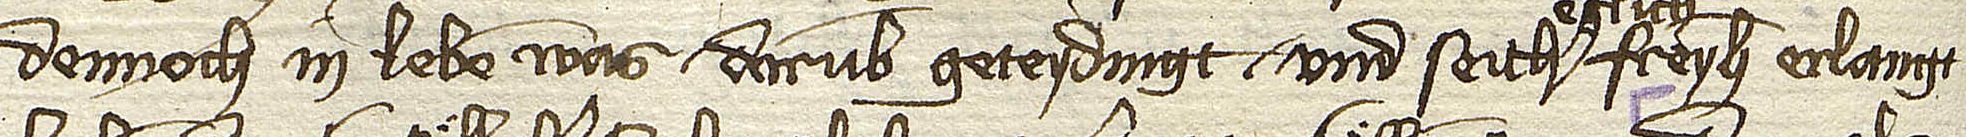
dennoch in lebe* was / daru*b geteydingt / vnd ſeith* freyh* erlangt
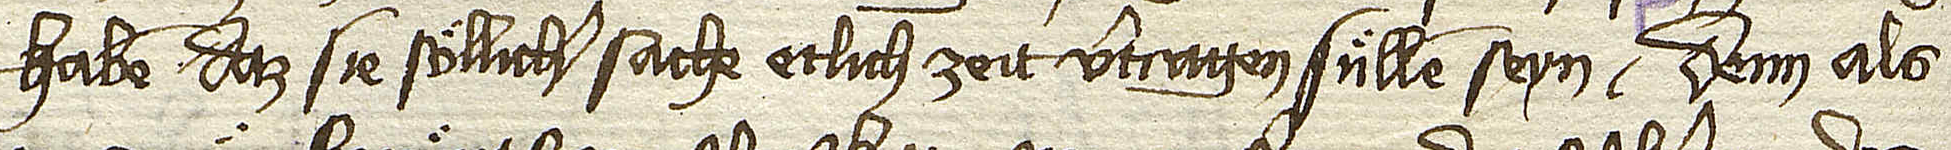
habe* daʒ ſie ſöllich* ſache etlich ʒeit v*tragen ſülle* ſeyn / Denn als
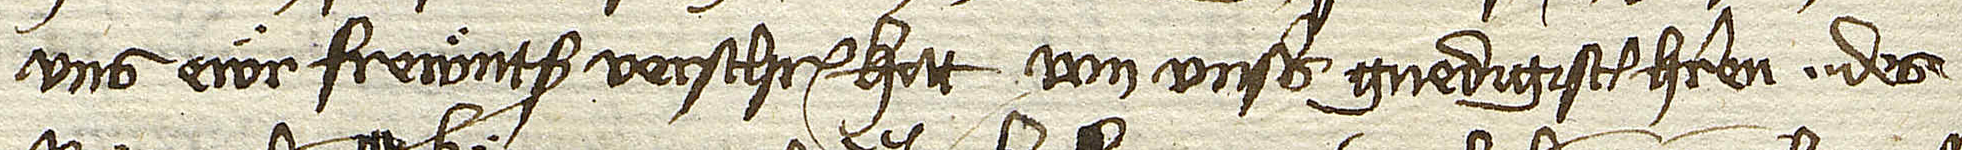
vns ewr frewntſ* verſchr* hat von vnſ*s gnedigiſt* h*ren ~ des
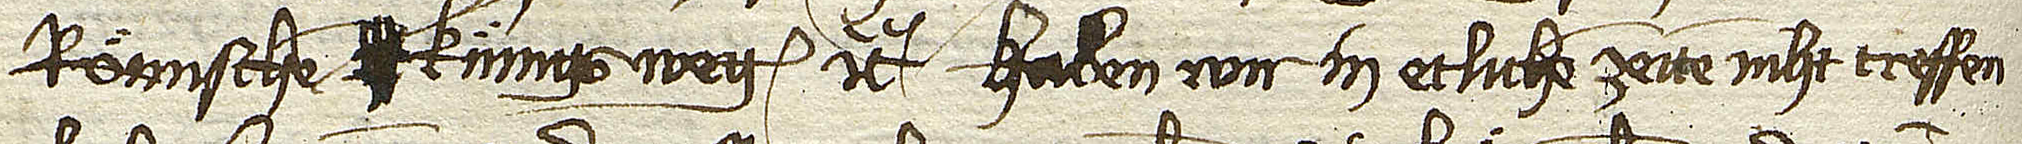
Römiſche* ec* künigs weg* ec* / haben wir in etliche* ʒeite* niht treffen
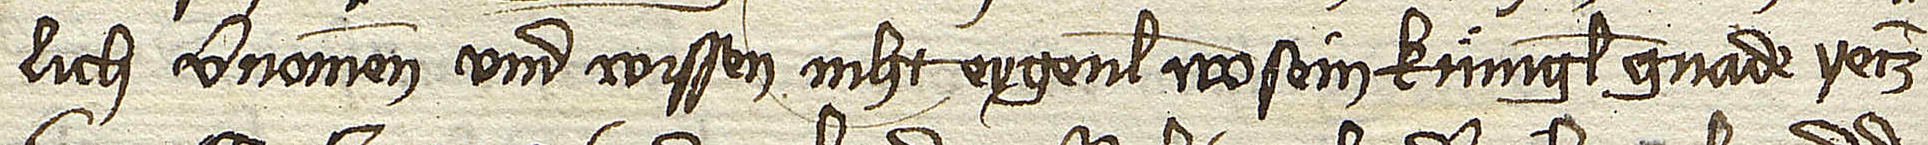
lich v*nomen* vnd wiſſen niht eygenl* wo ſein künigl* gnade yecʒ*
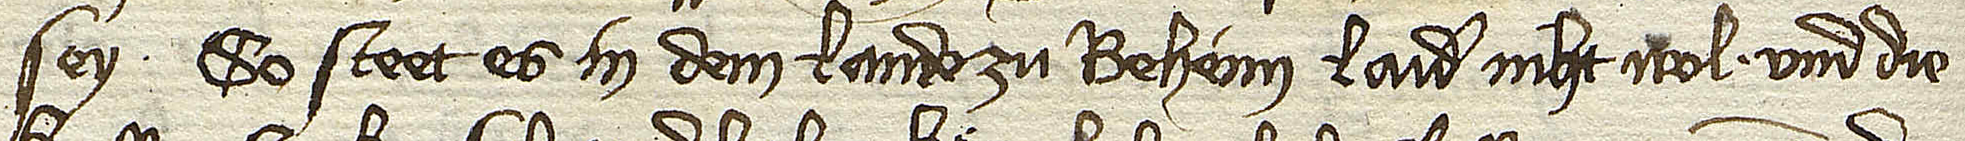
ſey . So ſteet es in dem lande ʒu Beheim laid* niht wol . vnd die
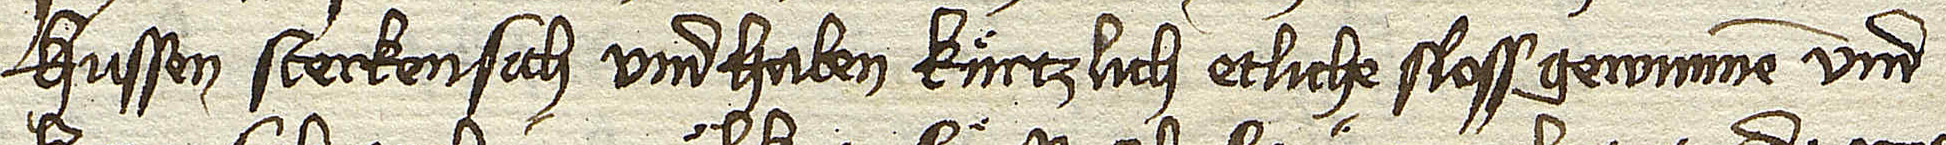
huſſen ſterken ſich vnd haben kürcʒlich etliche ſloſſ gewunne* vnd
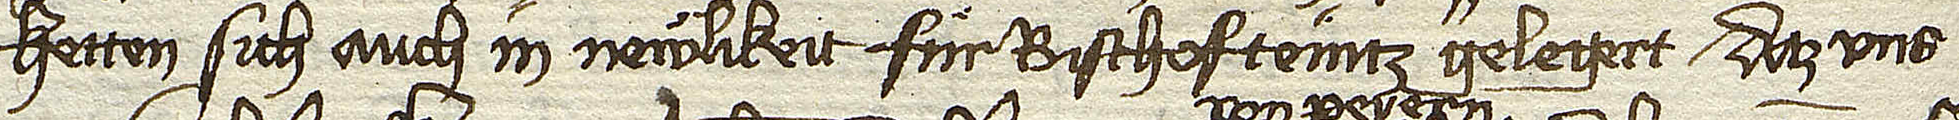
hetten ſich auch in newlikeit für Biſchofteincʒ gelegert / daʒ vns
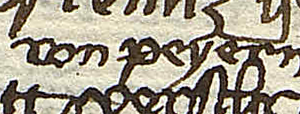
von Peyern
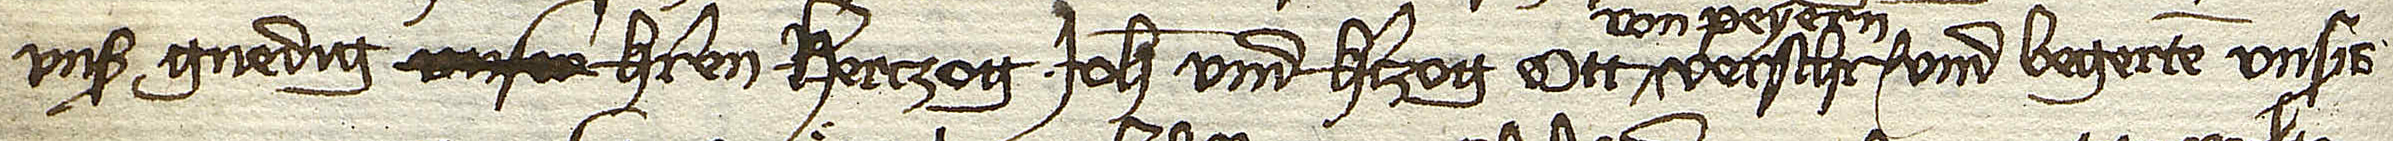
vnſ* gnedig vnſere h*ren Hercʒog . Ioh* vnd h*cʒog Ott verſchr* vnd begerte* vnſ*s
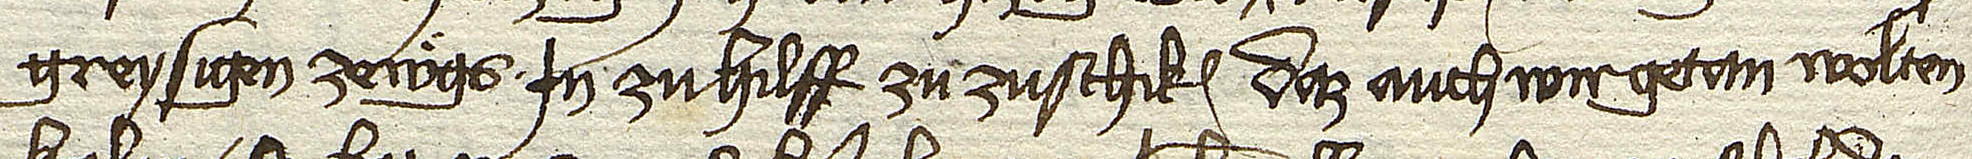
greyſigen ʒewgs . In ʒu hilff ʒu ʒuſchik* daʒ auch wir getan wolten
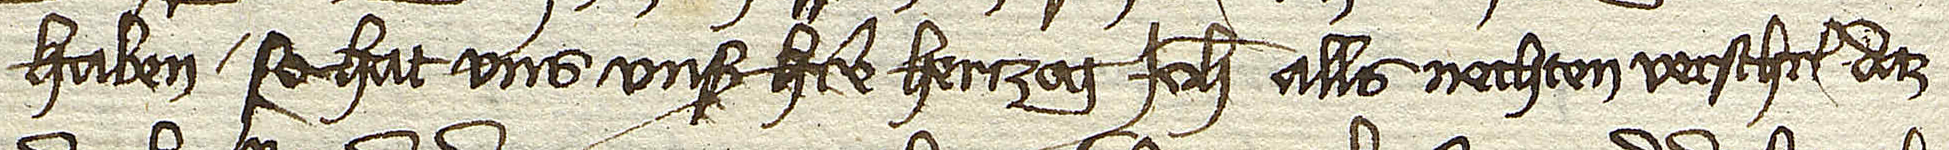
haben / ſo hat vns vnſ* h*re hercʒog Ioh* alls nechten verſchr* daʒ
